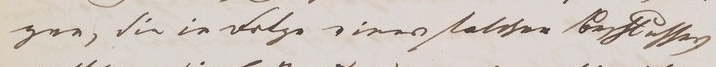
gen, die in Folge eines solchen Beschlusses
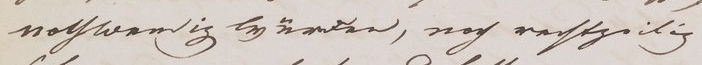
nothwendig würden, noch rechtzeitig
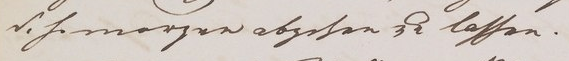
d. h. morgen abgehen zu lassen.
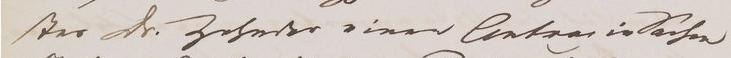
ster Dr. Zehnder einen Antrag in Sachen
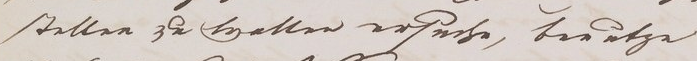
stellen zu wollen ersuche, benutze
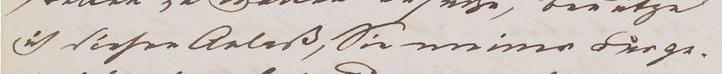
ich diesen Anlaß, Sie meiner ausge-
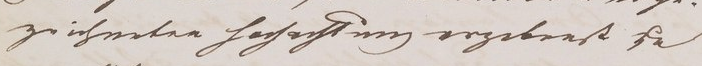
zeichneten Hochachtung ergebenst zu
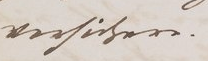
versichern.
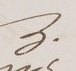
Z.
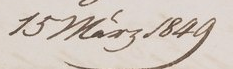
15 März 1849
